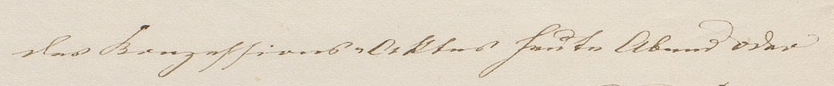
des Konzessions-Aktes heute Abend oder
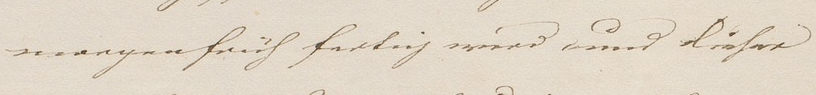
morgen früh fertig wird und dieser
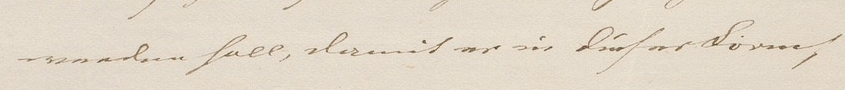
werden soll, damit er in dieser Form,
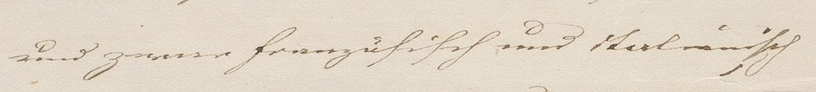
und zwar französisch und italienisch
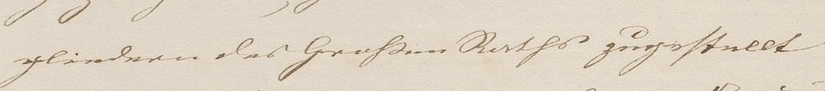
gliedern des Großen Raths zugestellt
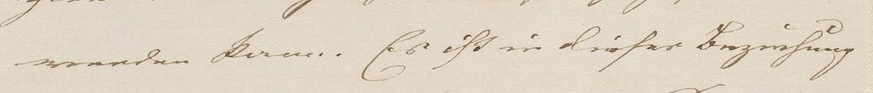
werden kann. Es ist in dieser Beziehung
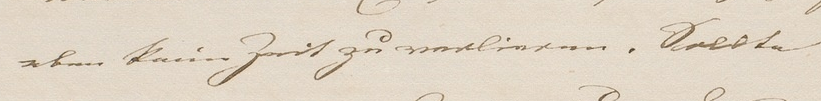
eben keine Zeit zu verlieren. Sollte
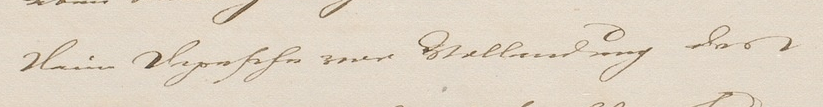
Deine Depesche vor Vollendung des
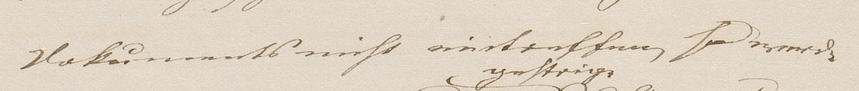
Dokuments nicht eintreffen, so werde
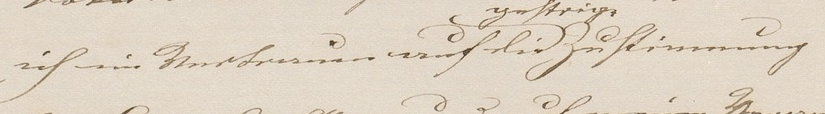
ich im Vertrauen auf die gestrige Zustimmung
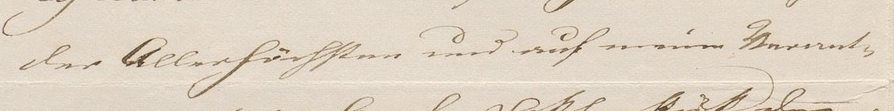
der Allerhöchsten und auf meine Verant-
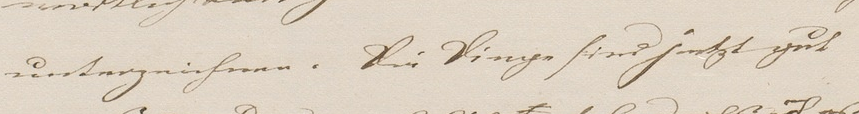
unterzeichnen. Die Dinge sind jetzt gut
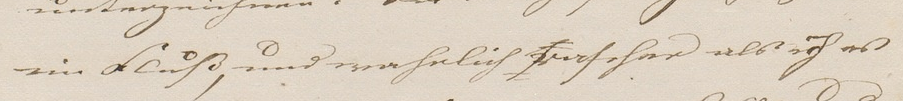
im Fluß, und wahrlich rascher als ich es
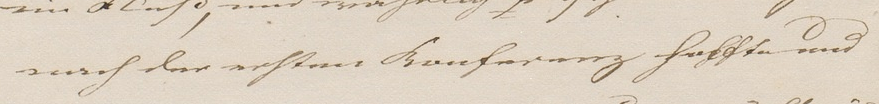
nach der ersten Konferenz hoffte und
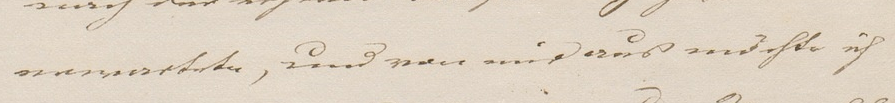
erwartete, und von mir aus möchte ich
